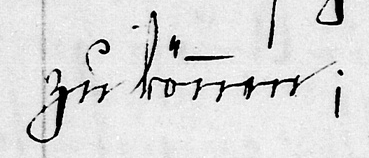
zu können;
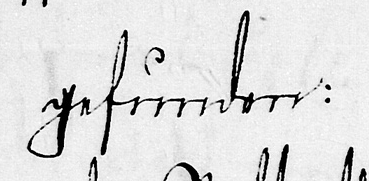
gefunden:
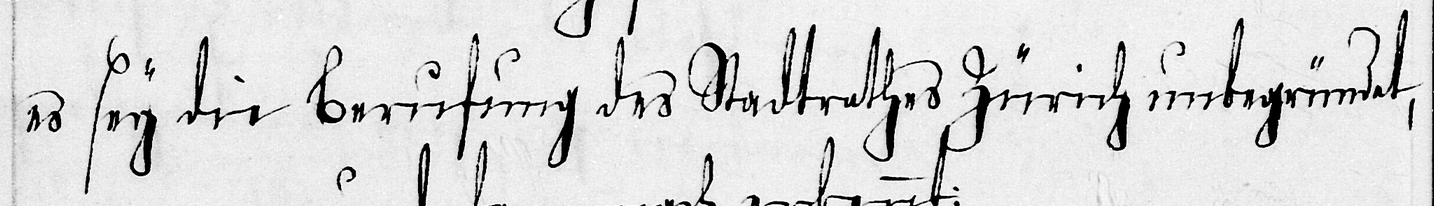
es sey die Berufung des Stadtrathes Zürich unbegründet,
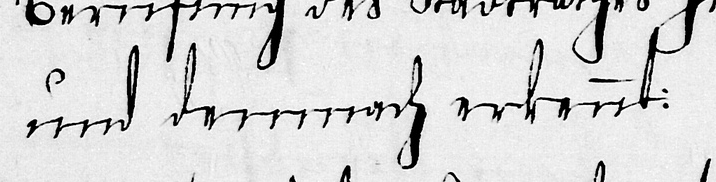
und demnach erkennt:
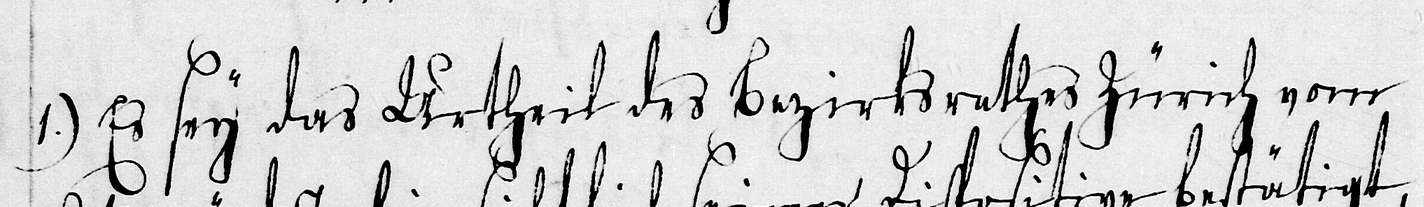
1.) Es sey das Urtheil des Bezirksrathes Zürich vom
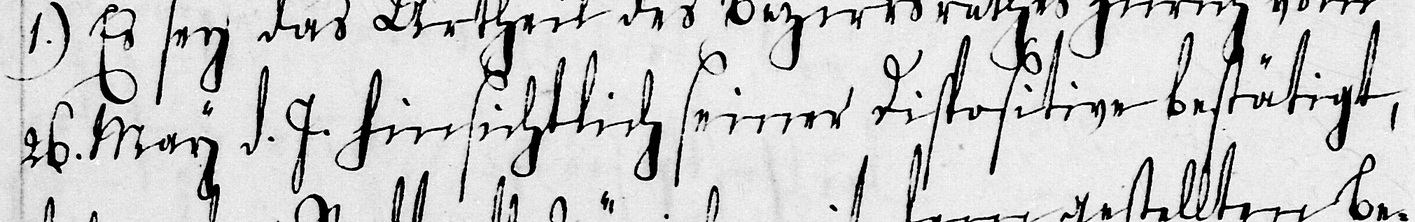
26. May d. J. hinsichtlich seiner Dispositive bestätigt,
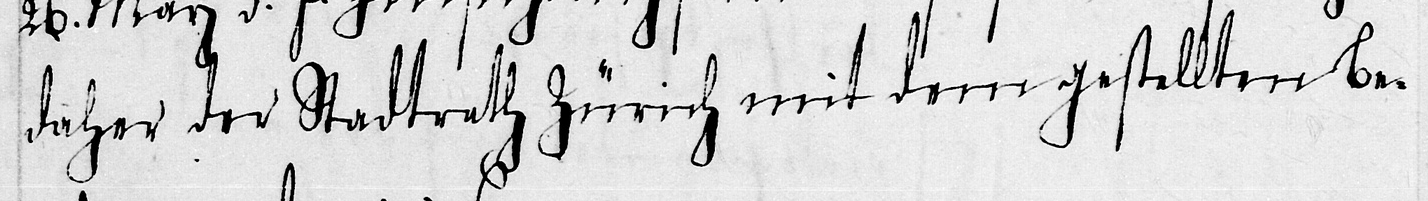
daher der Stadtrath Zürich mit dem gestellten Be¬
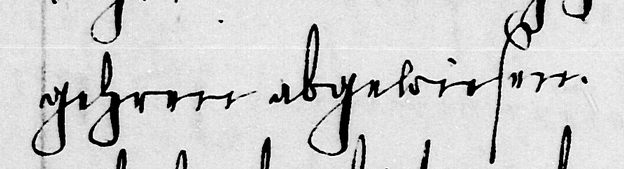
gehren abgewiesen.
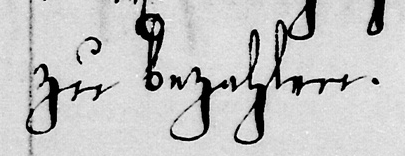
zu bezahlen.
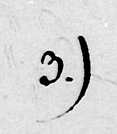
2.)
